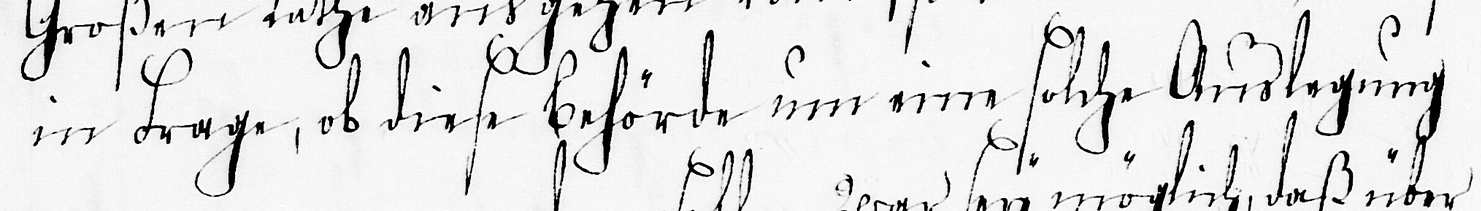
in Frage, ob diese Behörde um eine solche Auslegung
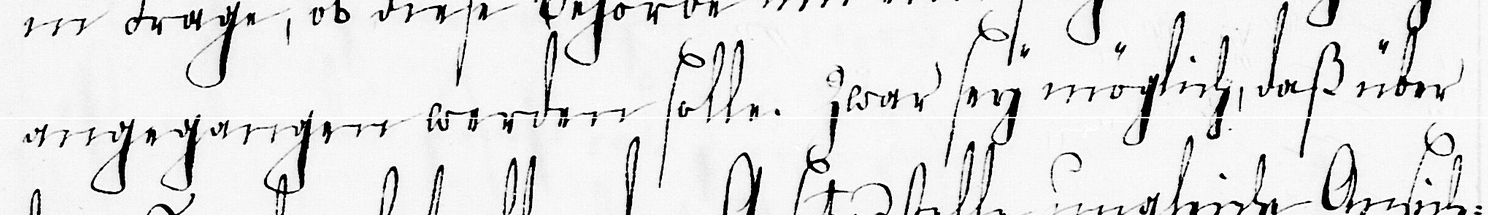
angegangen werden solle. Zwar sey möglich, daß über
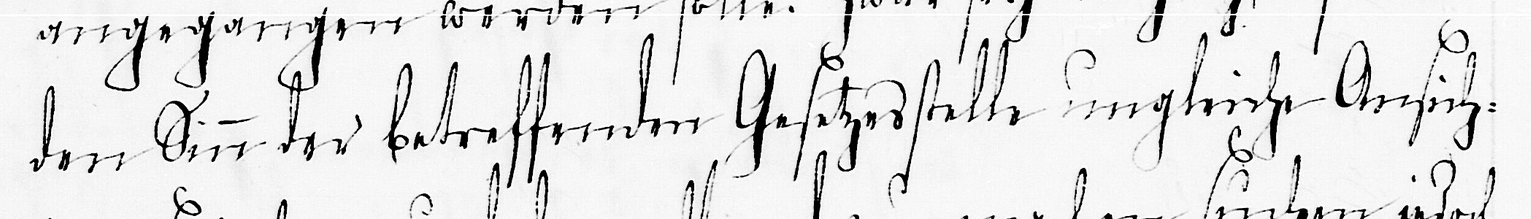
den Sinn der betreffenden Gesetzesstelle ungleiche
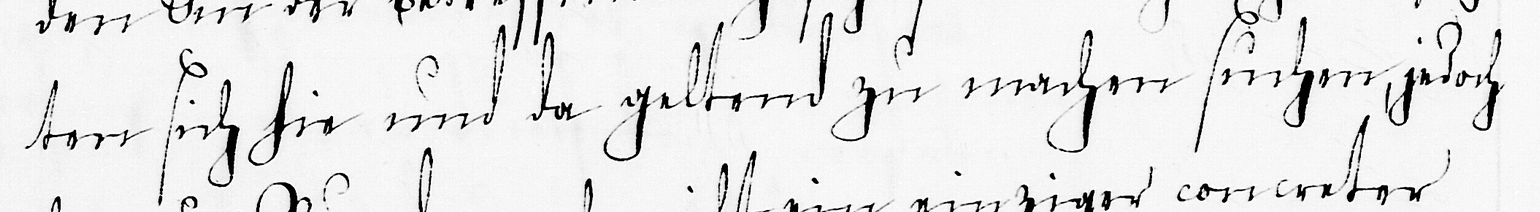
ten sich hie und da geltend zu machen suchen, jedoch
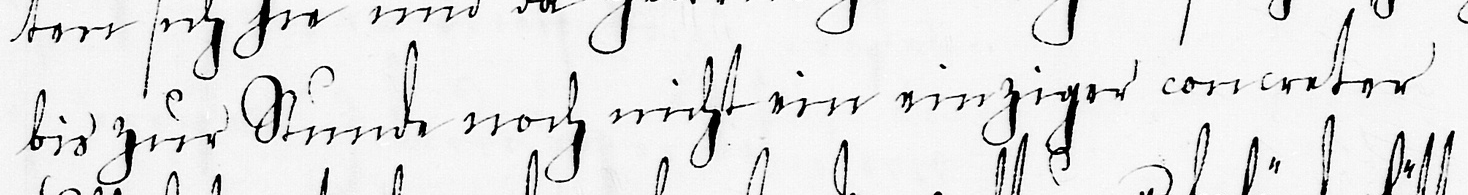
bis zur Stunde noch nicht ein einziger concreter
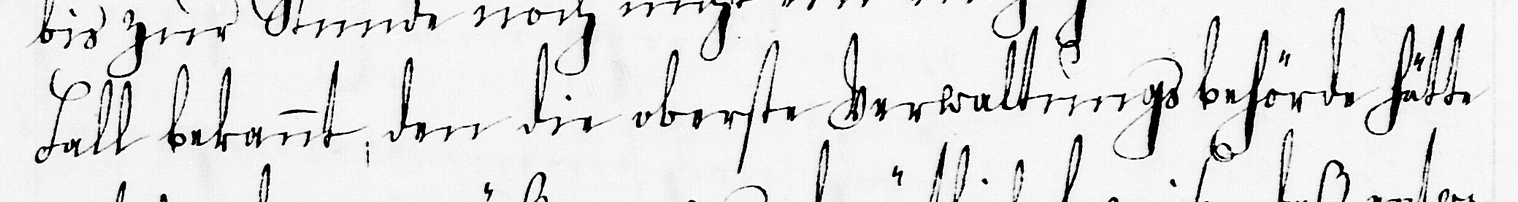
Fall bekannt, den die oberste Verwaltungsbehörde hätte
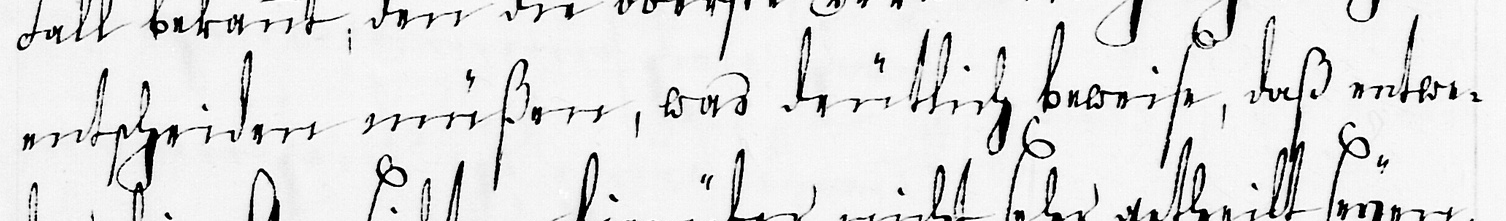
entscheiden müßen, was deutlich beweise, daß entwe¬
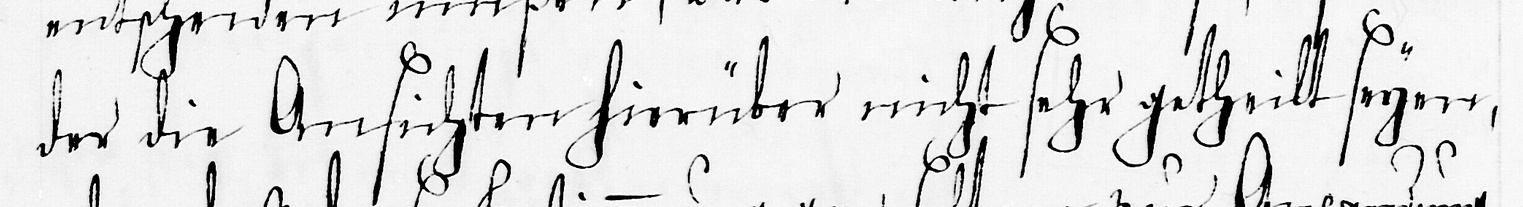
der die Anssichten hierüber nicht sehr getheilt seyen,
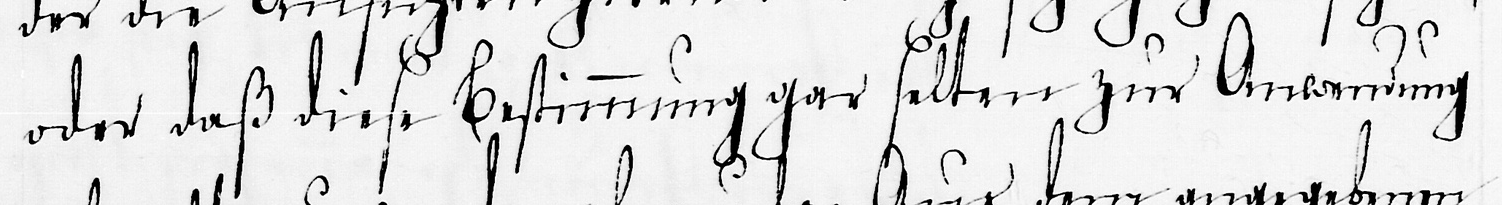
oder daß diese Bestimmung gar selten zur Anwendung
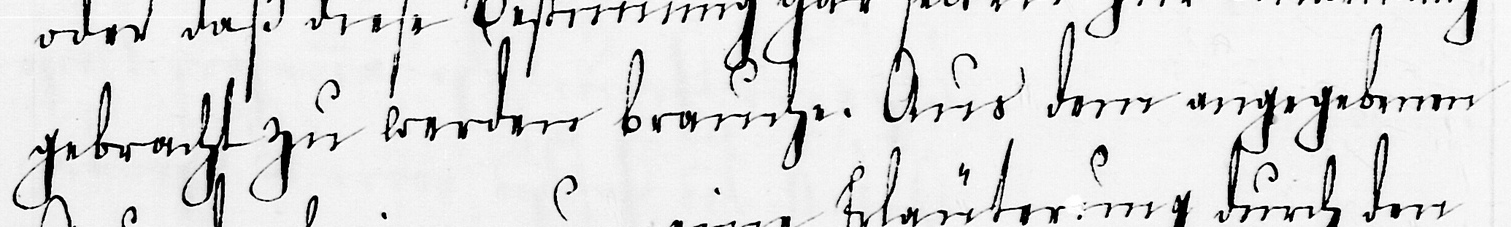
gebracht zu werden brauche. Aus dem angegebenen
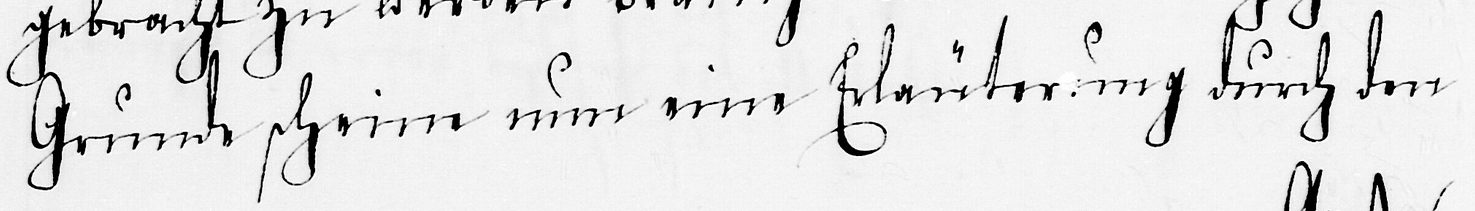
Grunde scheine nun eine Erläuterung durch den
